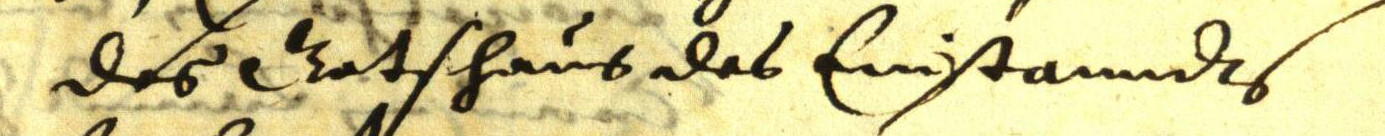des Gotshaūs des Einstanndts
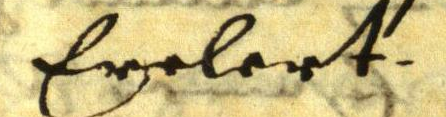Erclert.
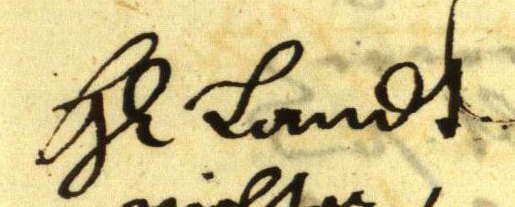Hl Landt-
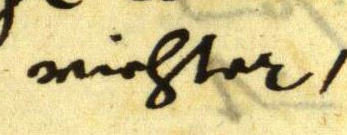richter,
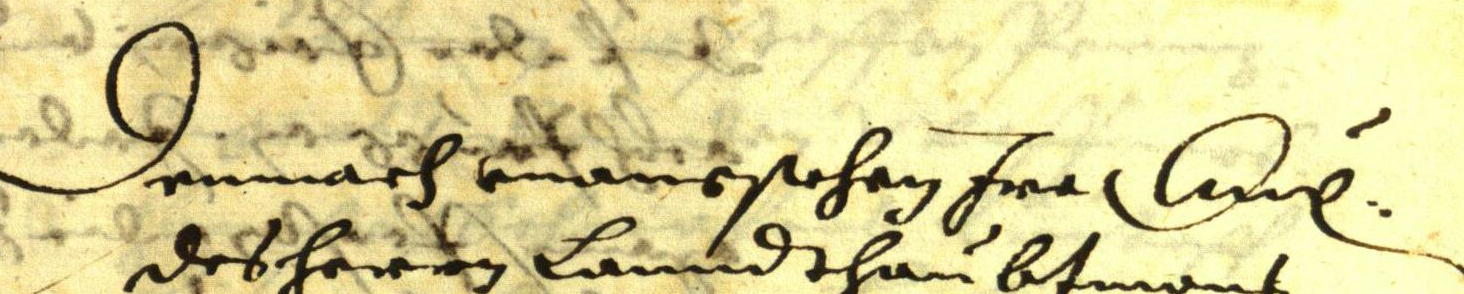Demnach vnangsehen Ire Gn:
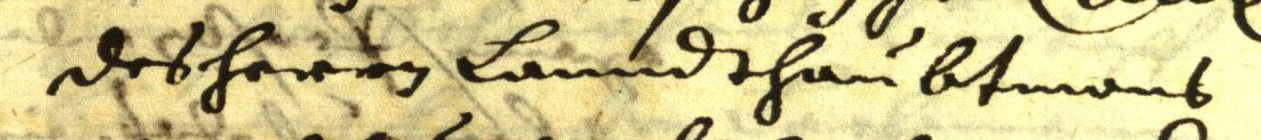des herrn Lanndthaūbtmans
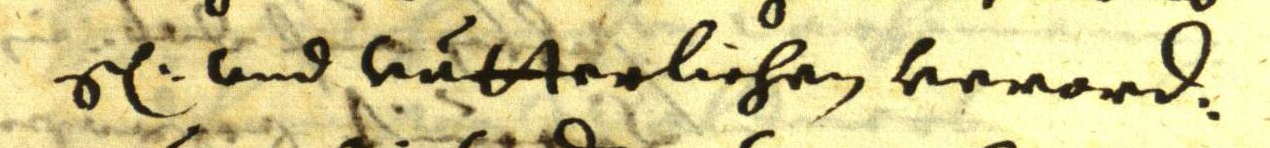g: vnd vätterlichen verord¬
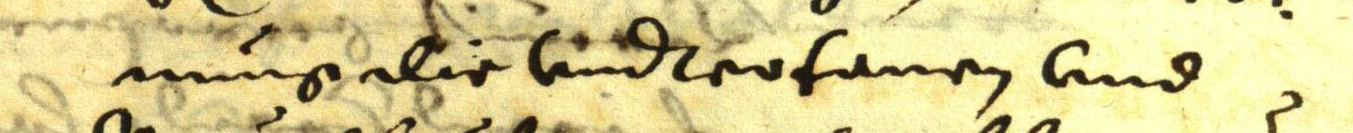nūng die vndtertanen vnd
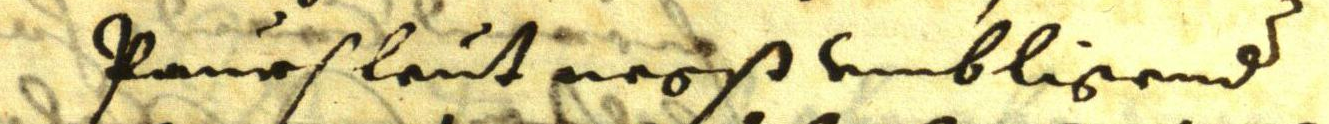Paūrsleūt negst vmbligend
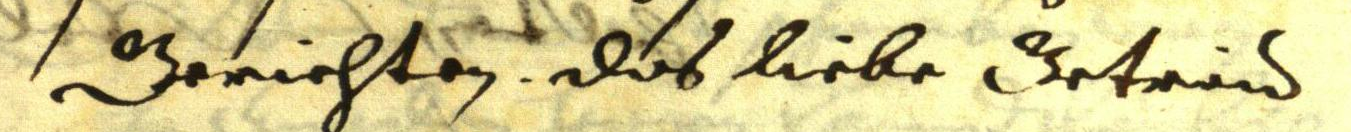Gerichten. das liebe Getreid
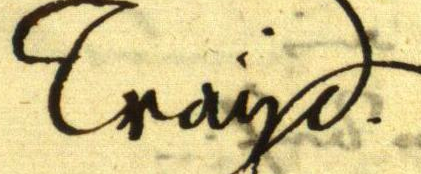Traÿd.
